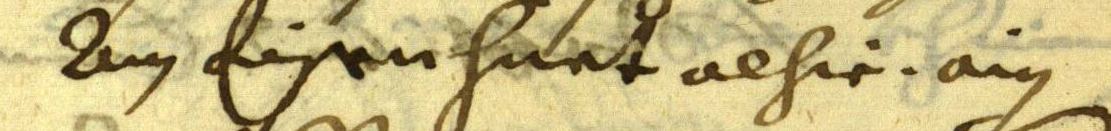Am Eisen hūet alhie. ain
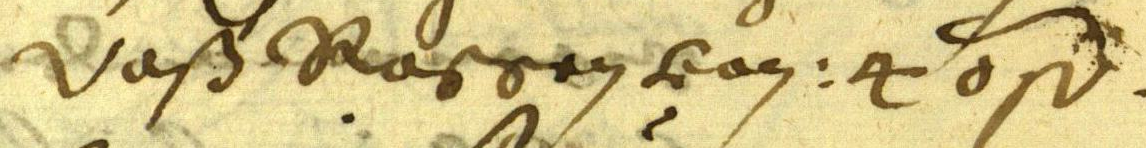Vaß Roggen von: 40 st.
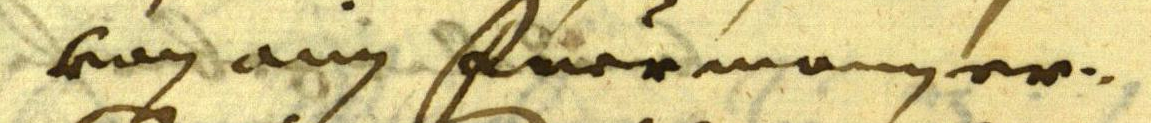von aim Fūermann er¬
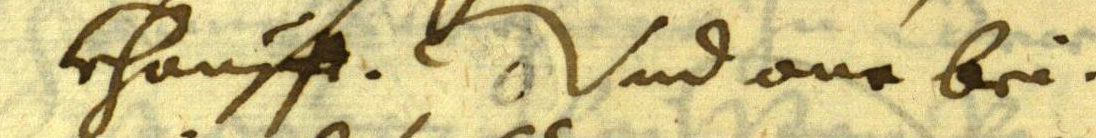khaūfft. Vnd one bei¬
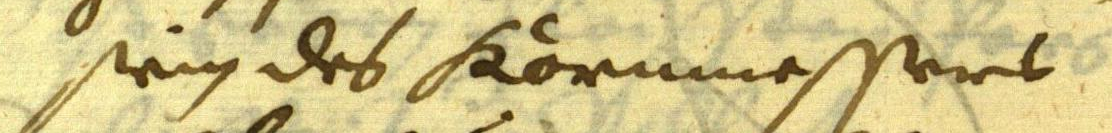sein des Kornmessers
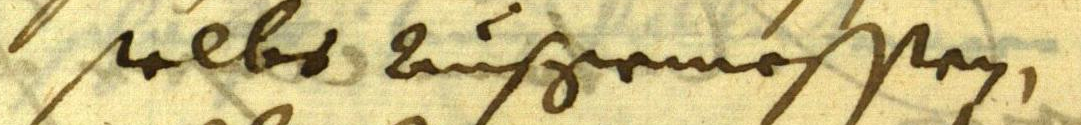selbs Aūsgemessen,
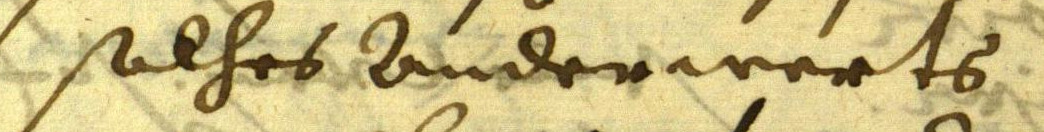solhes Anderwerts
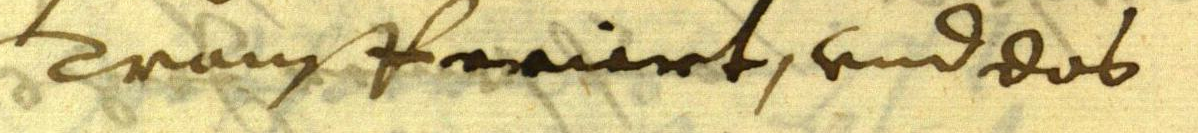Transferiert, vnd das
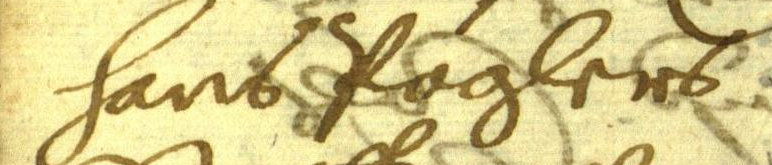hans Pōglers
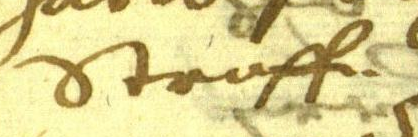Straff.
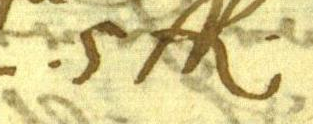—. 5 fl.
